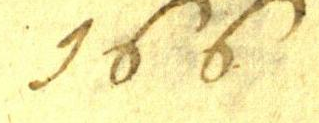166
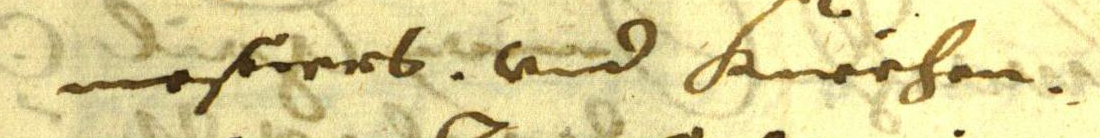mesners. vnd Kirchen¬
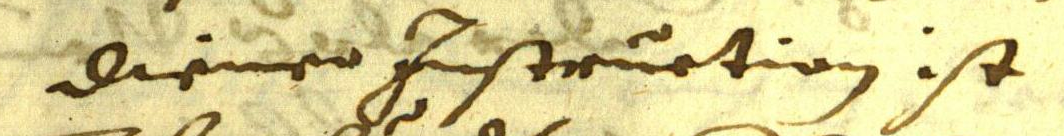diener Instrūction ist
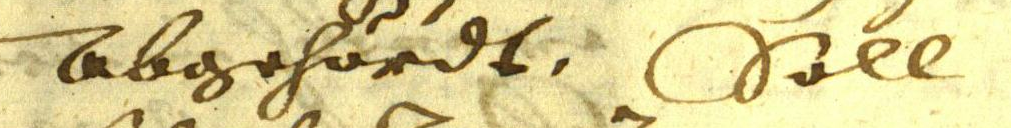Abgehōrdt. Soll
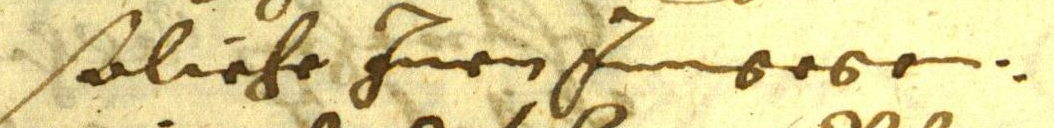soliche Inen Inngegen¬
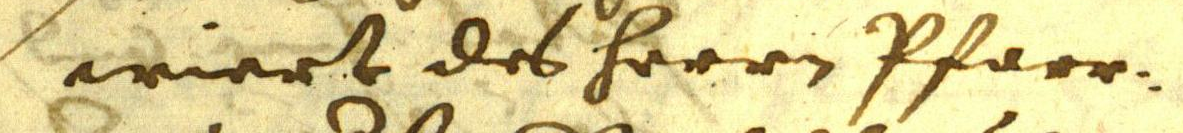wiert des herrn Pfarr¬
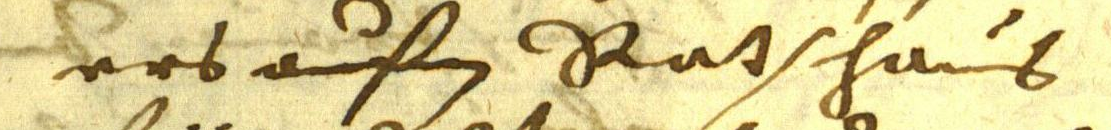ers aūfm Ratshaūs
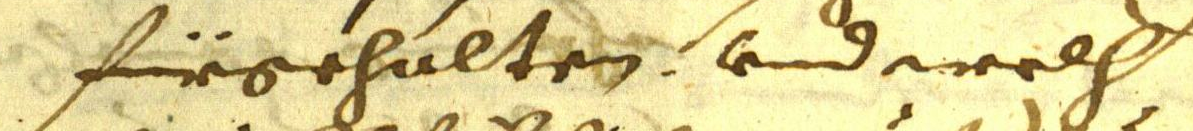fürgehalten. vnd welh
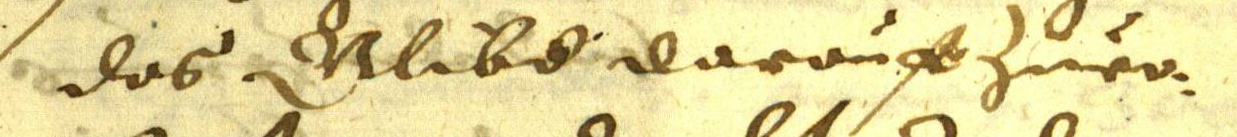das Glibd daraūf Zūer¬
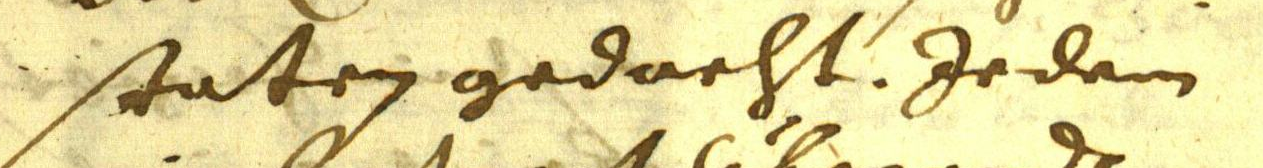staten gedacht. Jedem
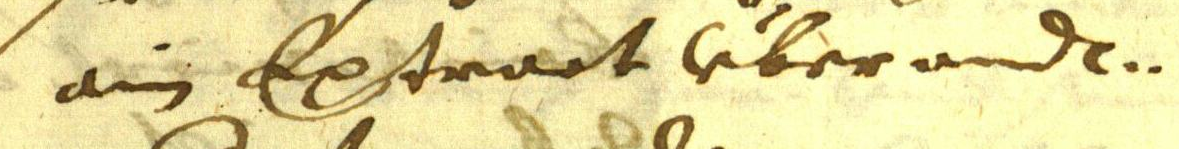ain Extract v̄ber andt¬
